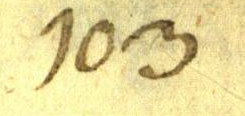103
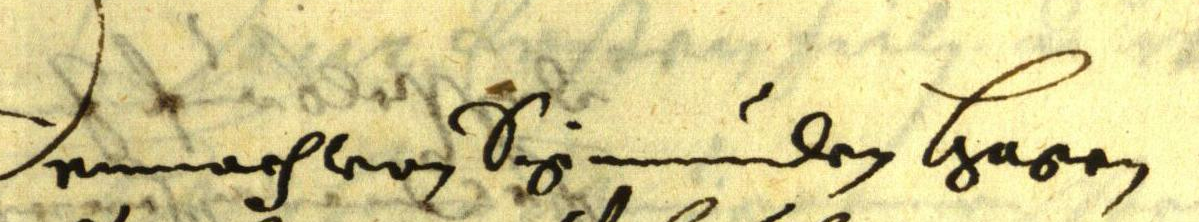Demnach von Sigmūnden Hagen
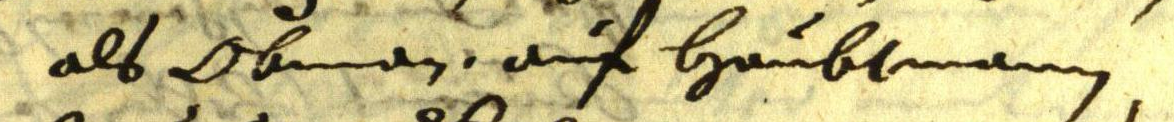als Obman. aūf haūbtmann
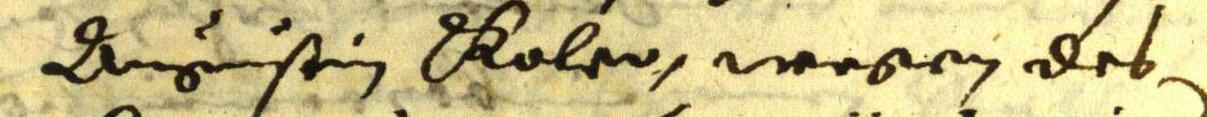Aūgūstin Koler, wegen des
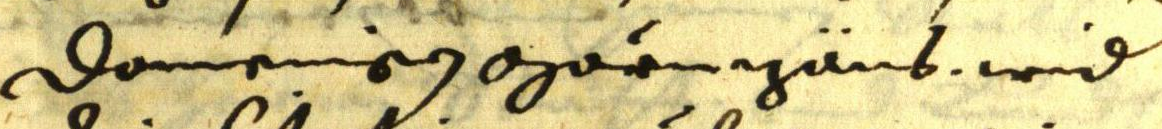Domenigen Mārnzäns. wid
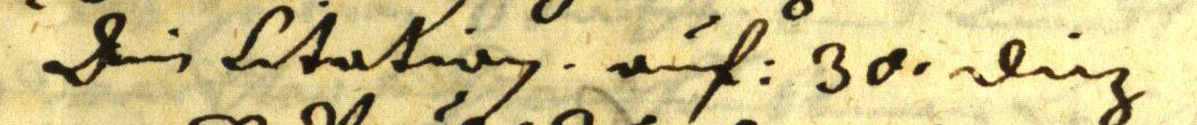Ain Citation. aūf: 30. diz
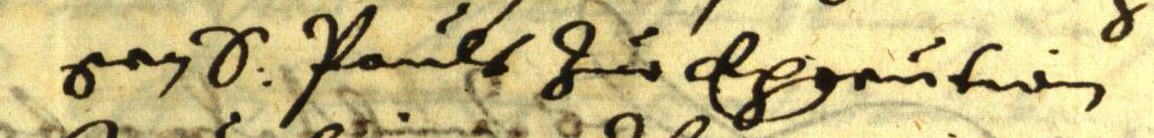gen S: Paūls Zūr Execūtion
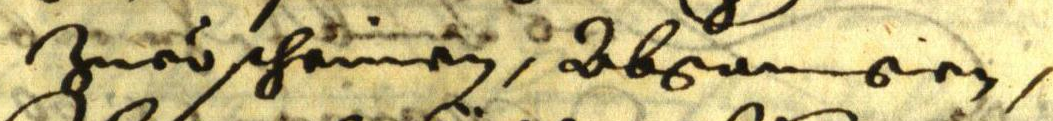Zūerscheinen, Abganngen,
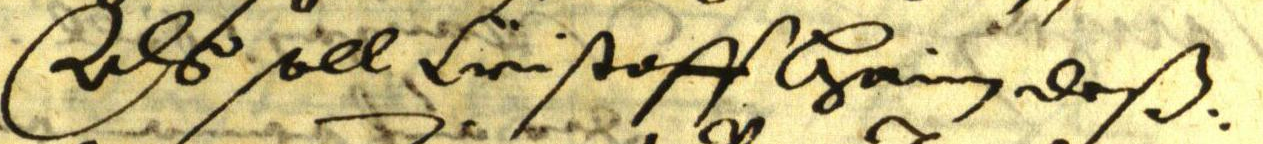Als soll Cristoff Haim deß¬
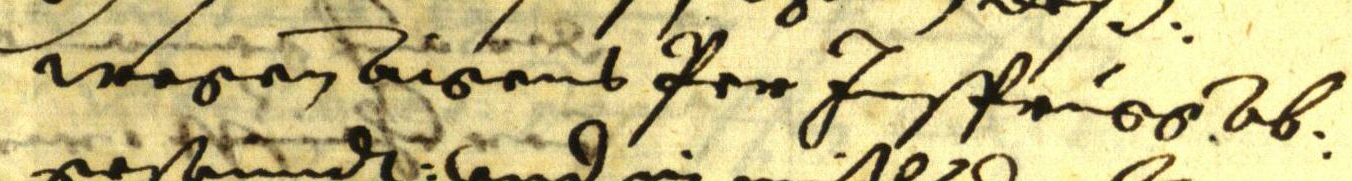wegen Aigens Per Insprūgg Ab¬
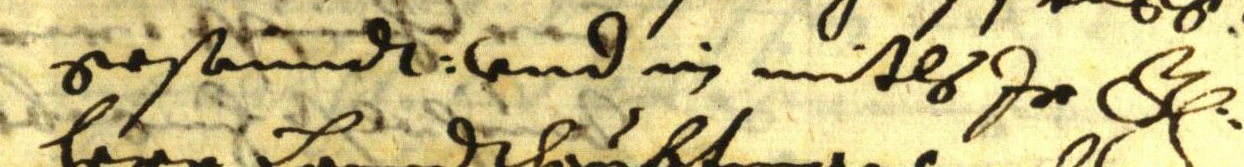gesanndt: vnd in mitls Ir G:
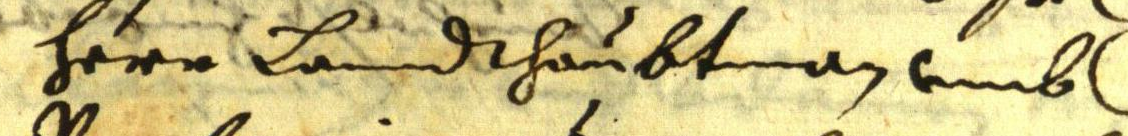herr Landthaūbtman vmb
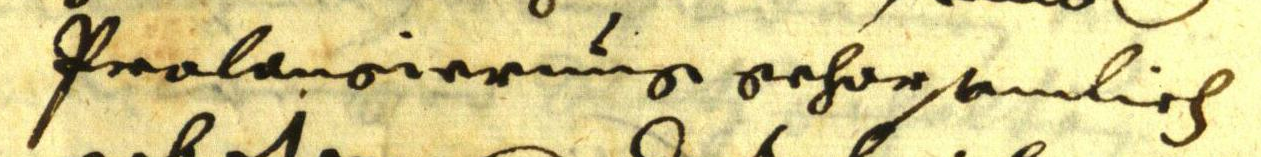Prolongierūng gehorsamlich
